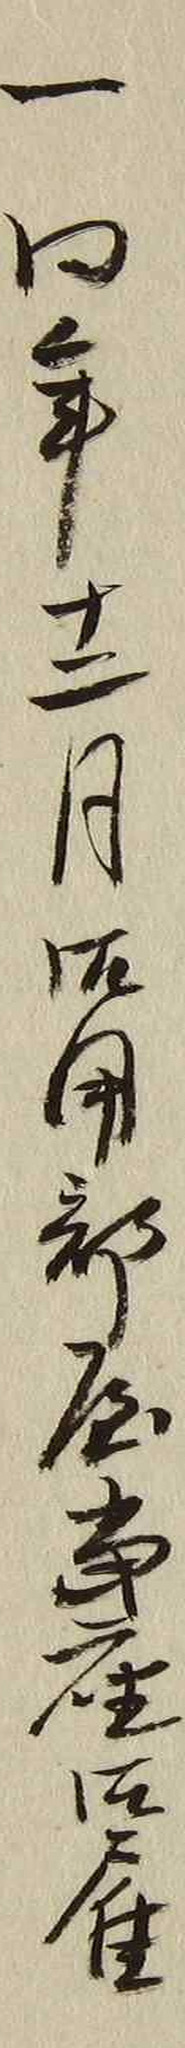一同年十二月御用部屋当座御雇
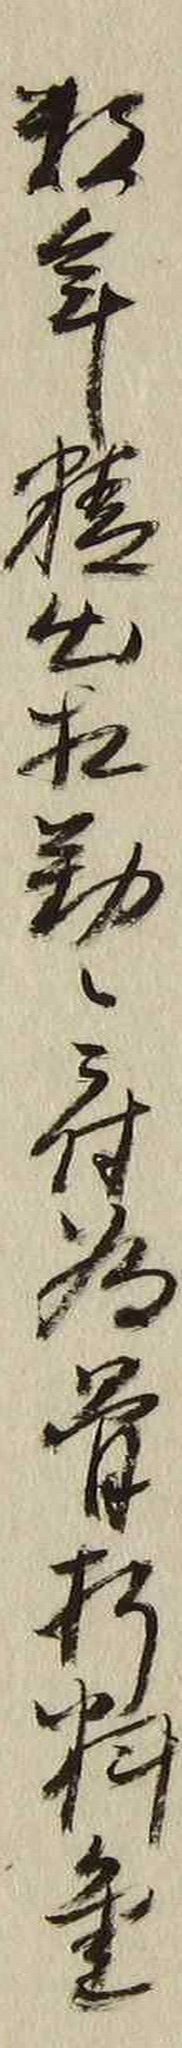数年精出相勤候ニ付為骨折料金
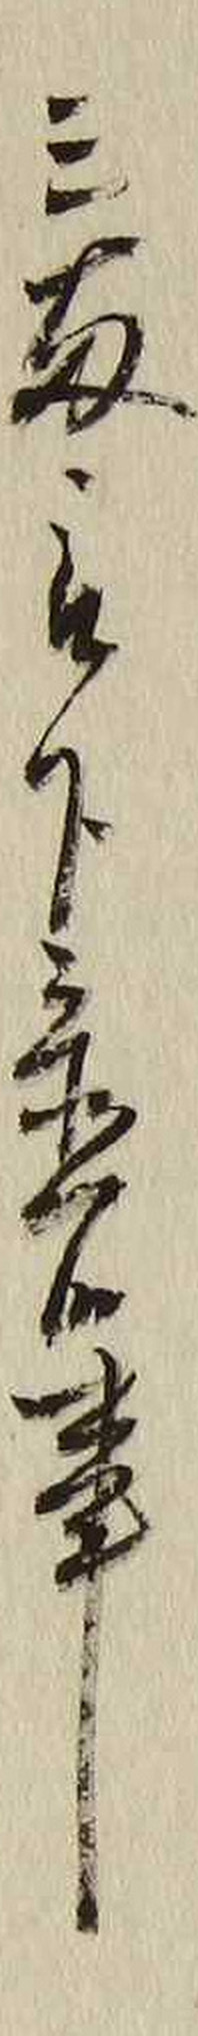三両被下置候事
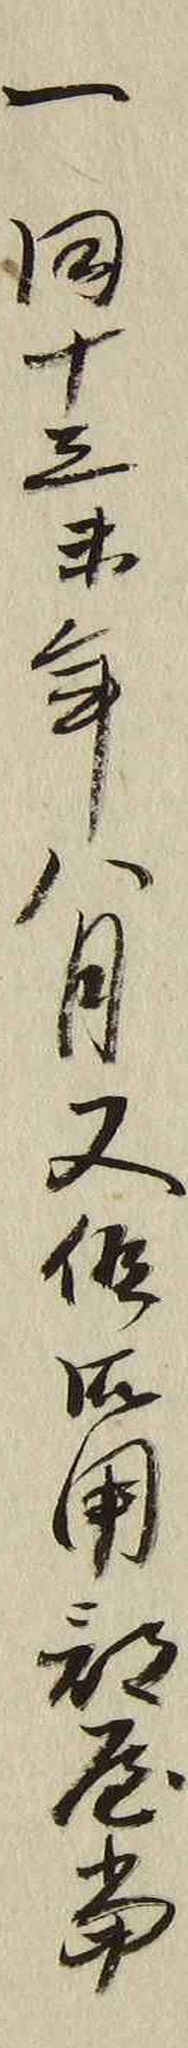一同十三未年八月又候御用部屋当
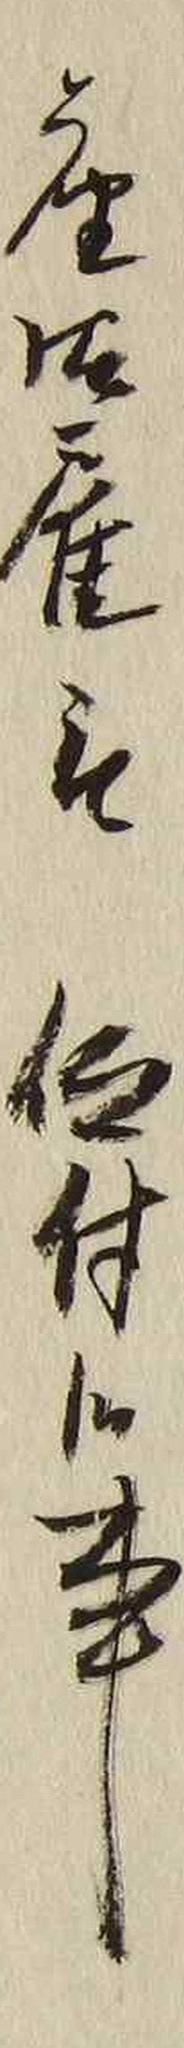座御雇被仰付候事
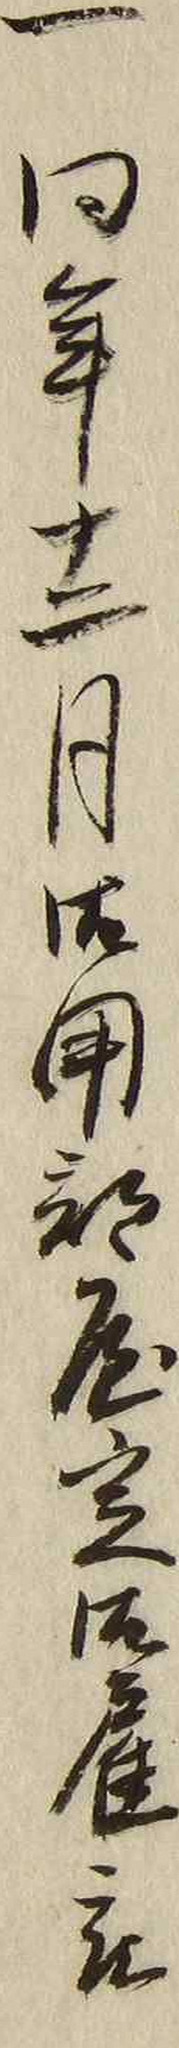一同年十二月御用部屋定御雇被

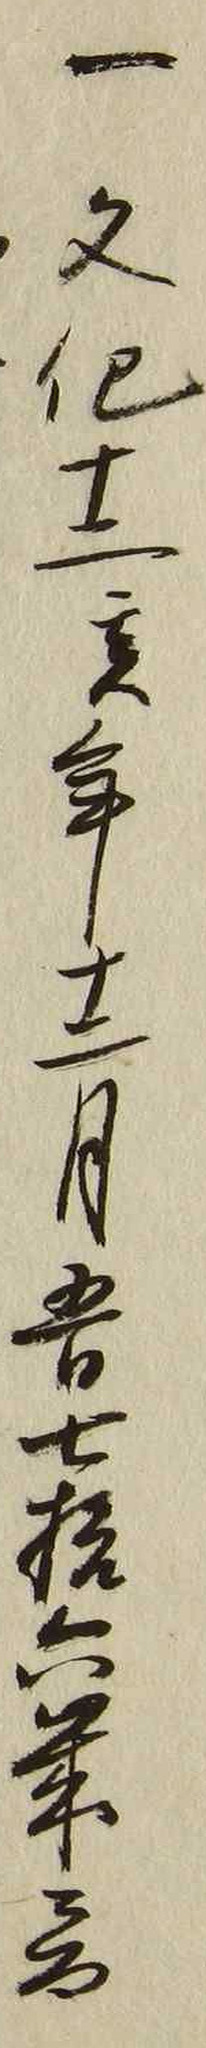一文化十二亥年十二月五日七拾六歳ニ而
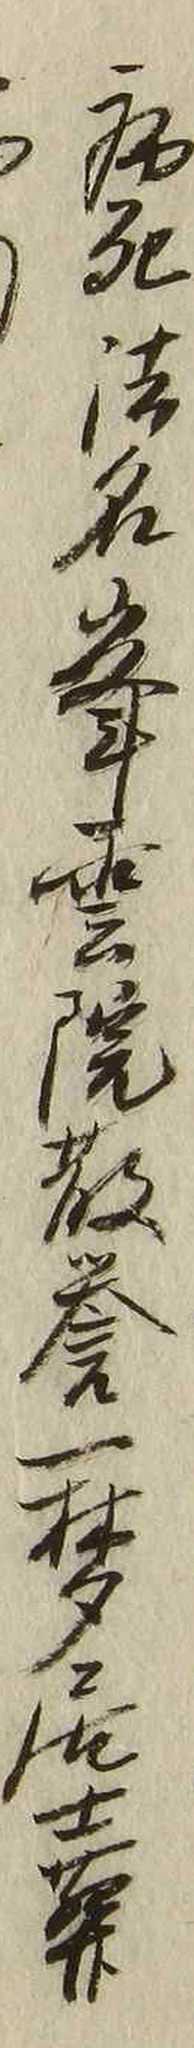病死法名峰雲院散誉一夢居士葬
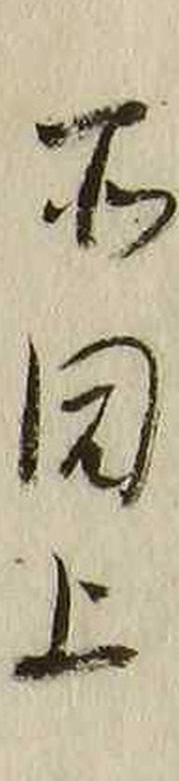所同上
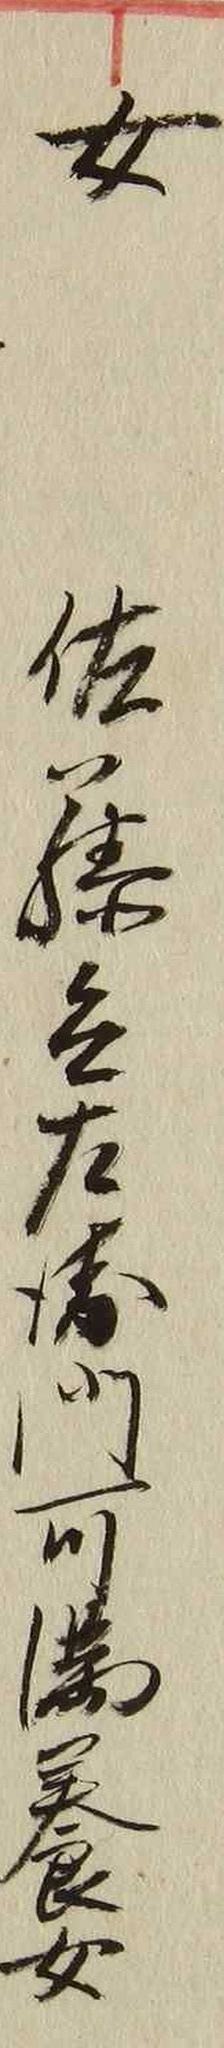女佐藤兵左衛門可満養女
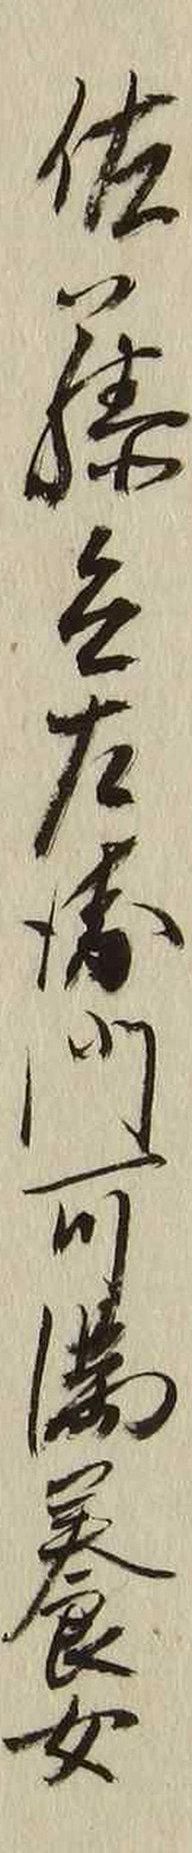女佐藤兵左衛門可満養女
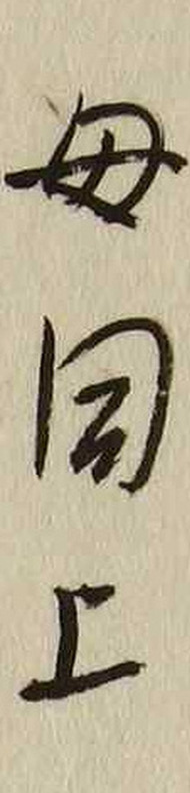母同上
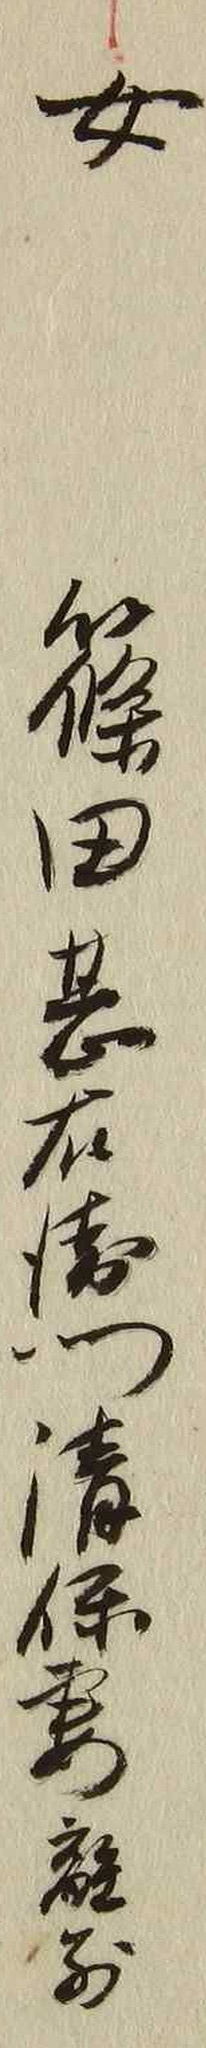女篠田甚右衛門清保妻離別
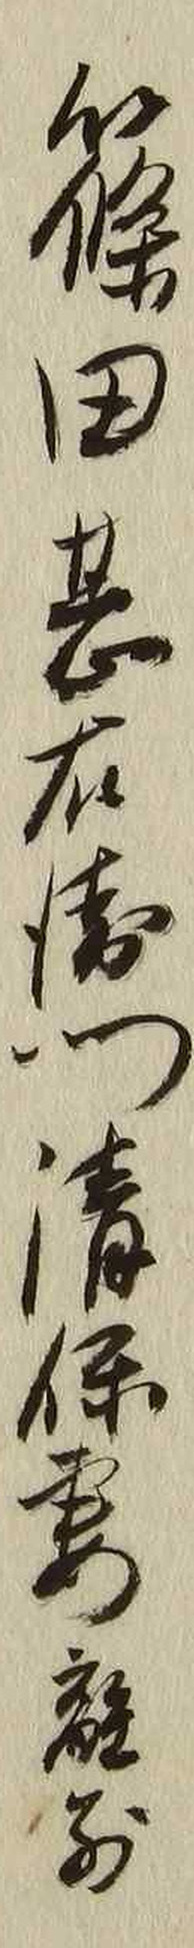女篠田甚右衛門清保妻離別
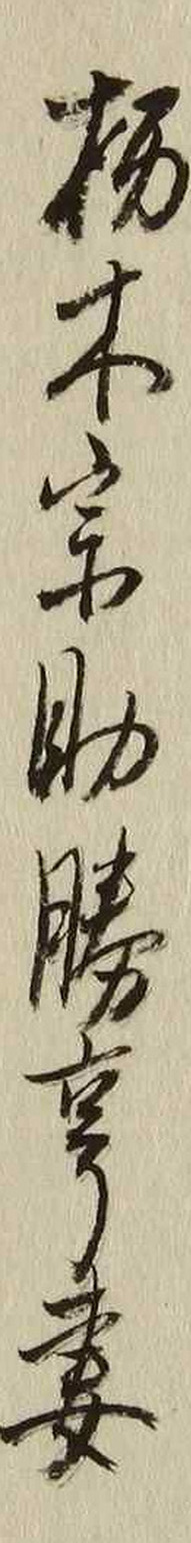栃木宗助勝亭妻
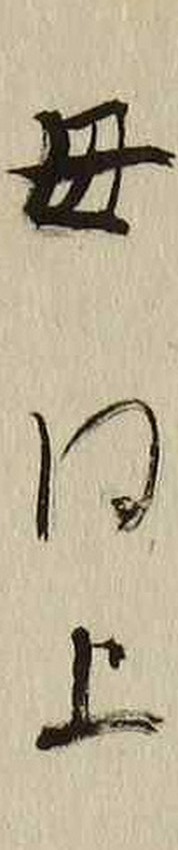母同上
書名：諸士系譜　巻之349　も之部5
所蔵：会津若松市立会津図書館
